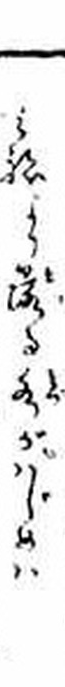みねより落ちる水がはめば
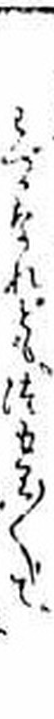わづかなれどもつもり〳〵て
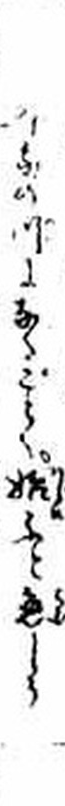みなの川になるごとく始ふと恋しう
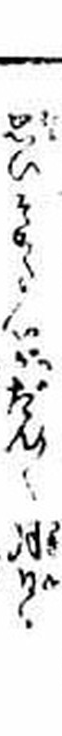思ひそめた心がだん〳〵月日々
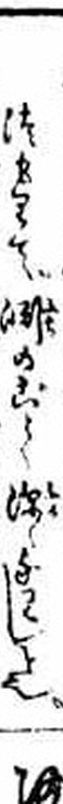つもりて淵のごとく深くなりし也陽成院

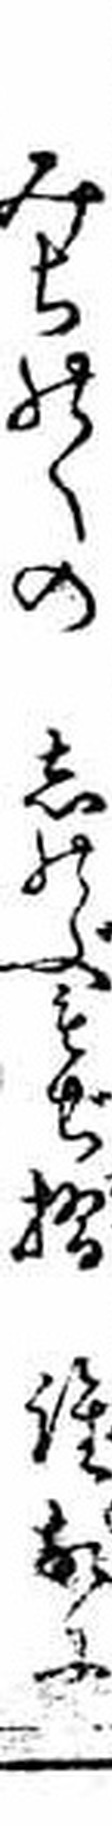みちのくのしのぶのぢ摺誰故に
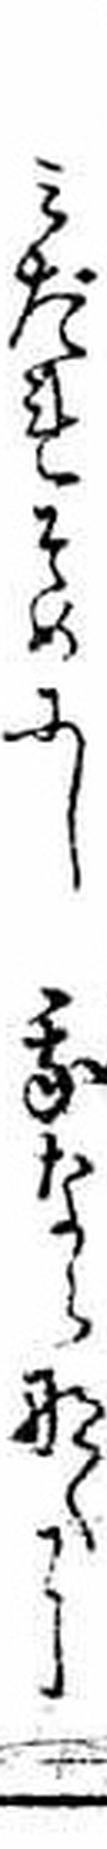みだれそめにし我ならなくに
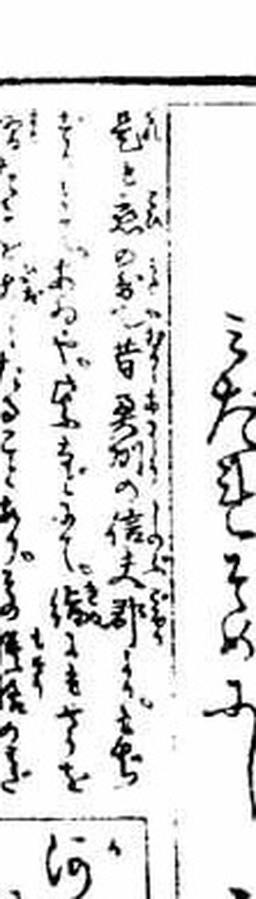是も恋の哥也昔奥州の信夫郡よりもぢ
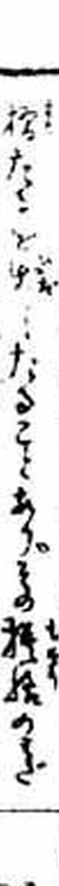摺たるを出したることありその模様のみだ左大
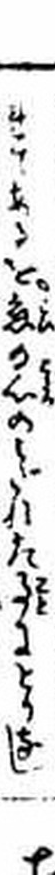れてあるを恋の心のみだれた事にとりなし臣
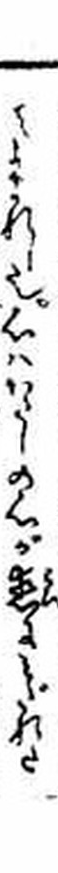てよまれし也心はわたしの心が恋にみだれた
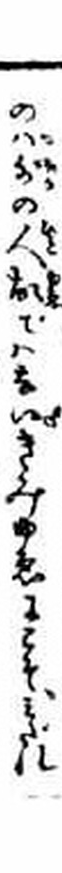のは外の人故ではないきみゆゑにこそみだれ
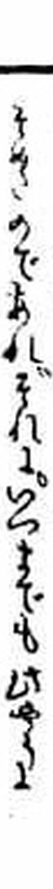そめたのであれはそれにいつまでも此やうに
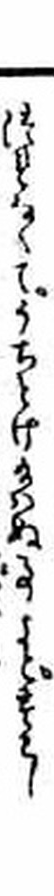つれなくてうちとけ給はぬ事よとすこし
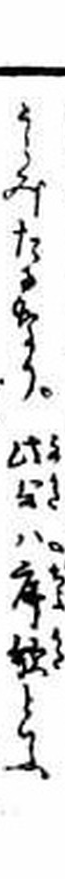うらみたるなり此方は序詞といふ
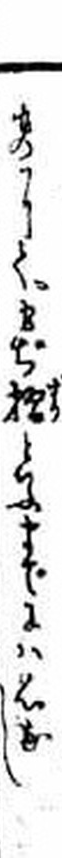ものにてもぢ摺といふまでには意なし
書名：小倉百人一首
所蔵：東京学芸大学教育コンテンツアーカイブ
